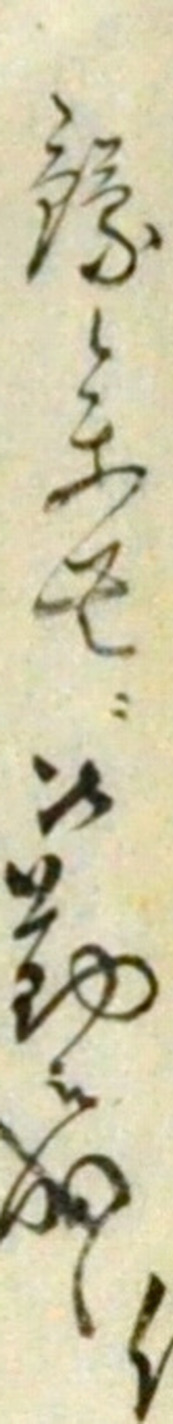予参共ニ御勤被成候
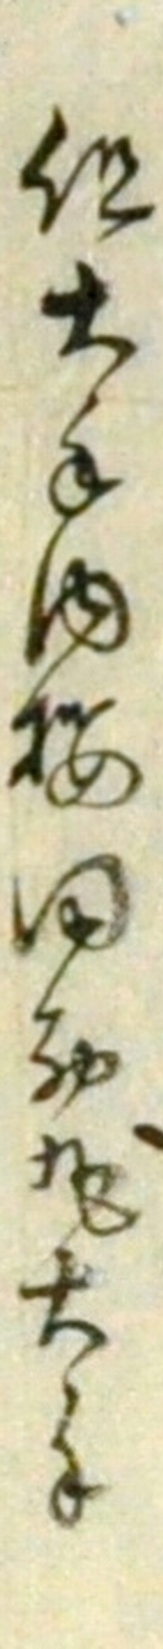但大手内桜田西丸大手
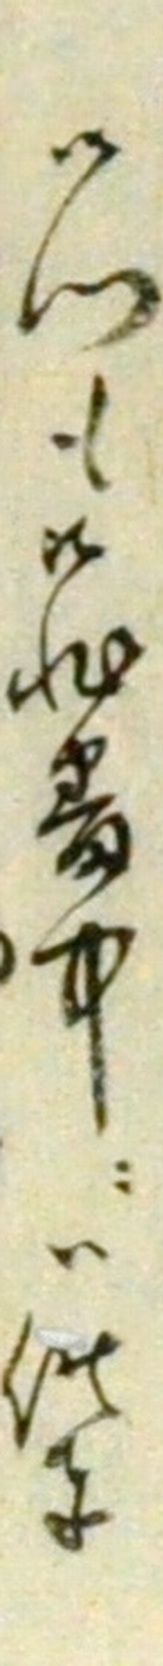御門も御非番中ニハ供奉
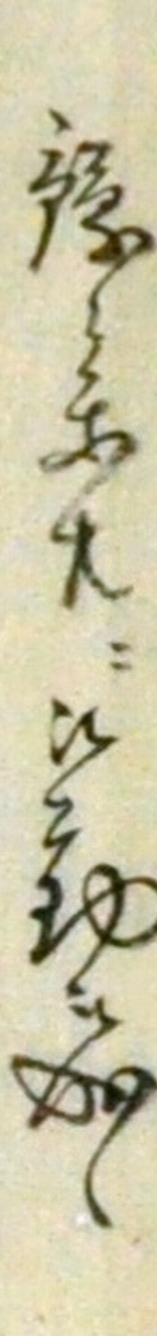予参共ニ御勤被成候
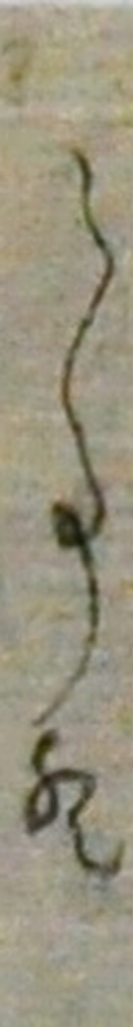之事歟
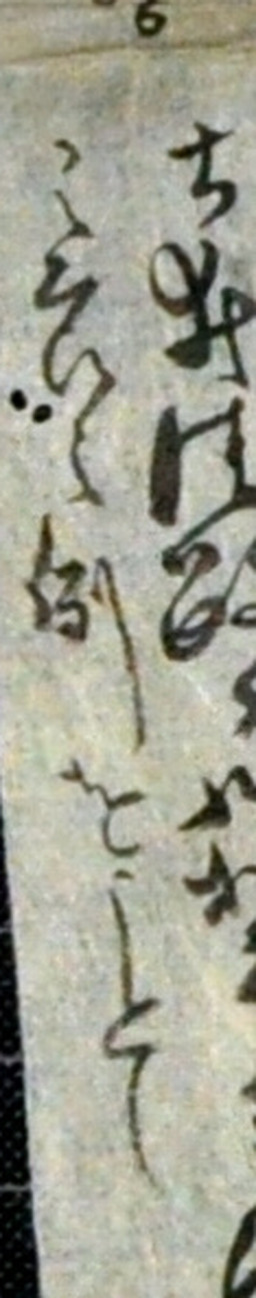之節之例を申上之

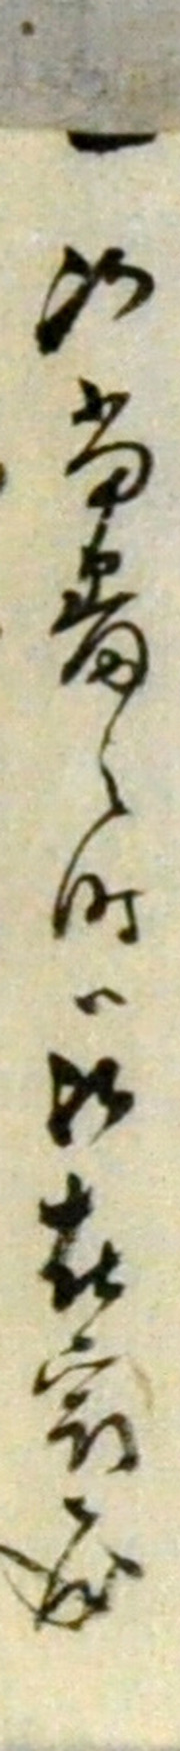一御当番之時は御在宿被成
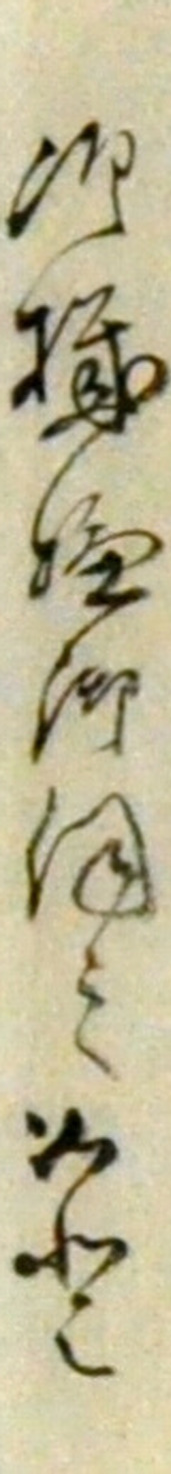御機嫌御伺之御登
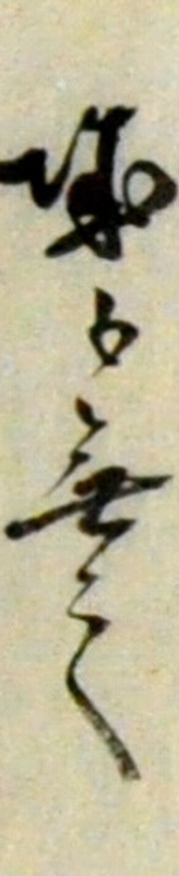城も無之

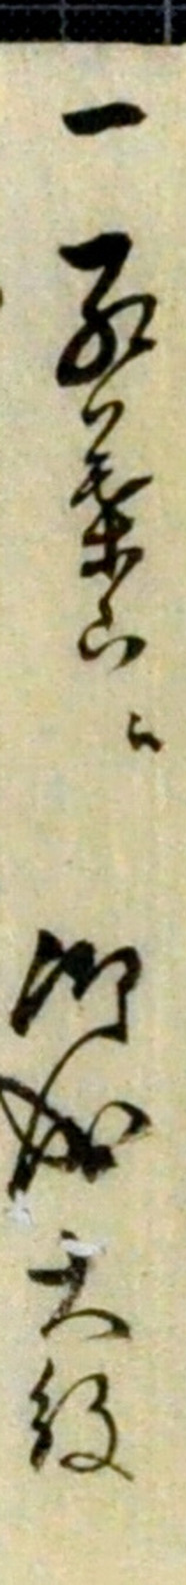一紅葉山江御成大紋
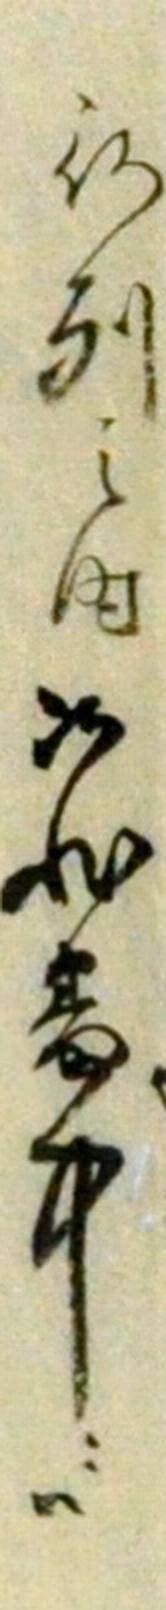行列之時御非番中ニハ
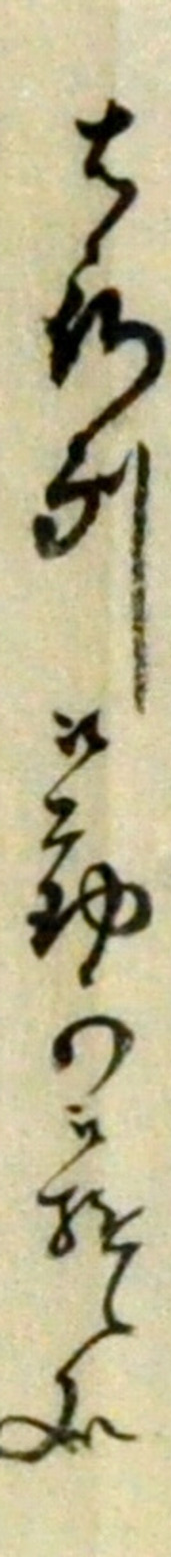右行列御勤可被遊候処
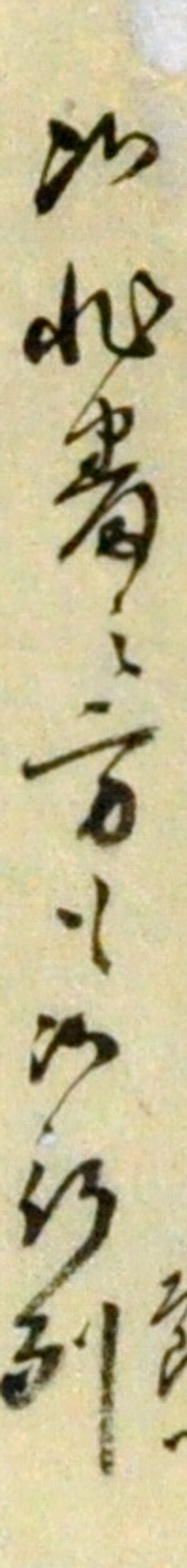御非番之方も御行列
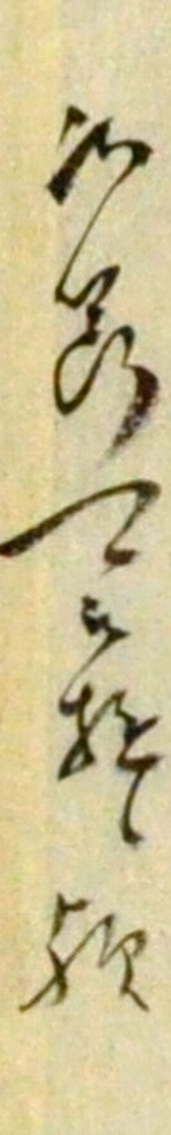御断可被遊候歟
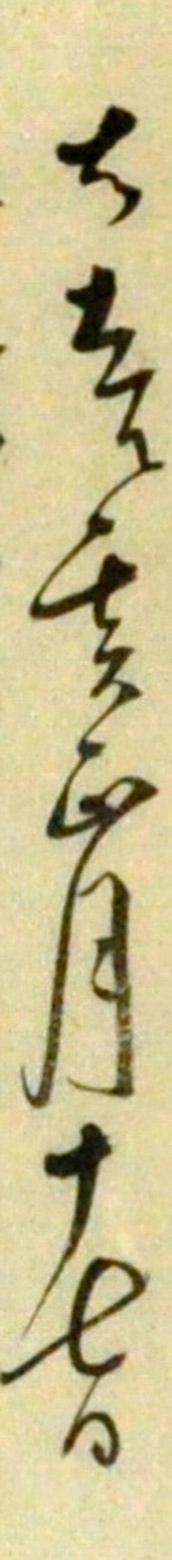右去ル亥正月十七日
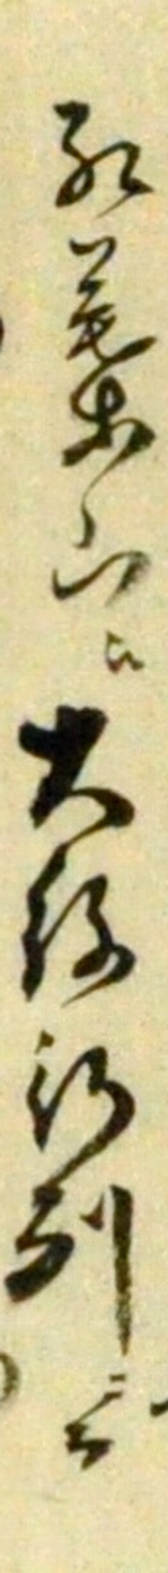紅葉山江大紋行列ニ而
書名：覚
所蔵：伊那市立高遠町図書館・合同会社AMANE
